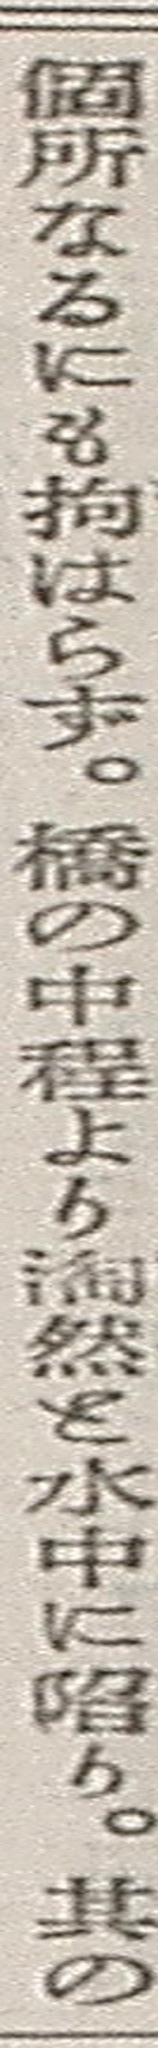個所なるにも拘はらず。橋の中程より淘然と水中に陥り。其の
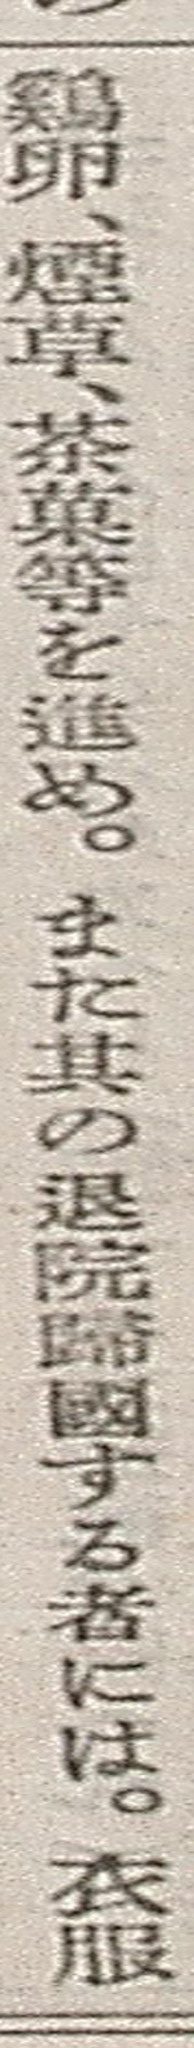鶏卵、煙草、茶菓等を進め。また其の退院帰国する者には。衣服
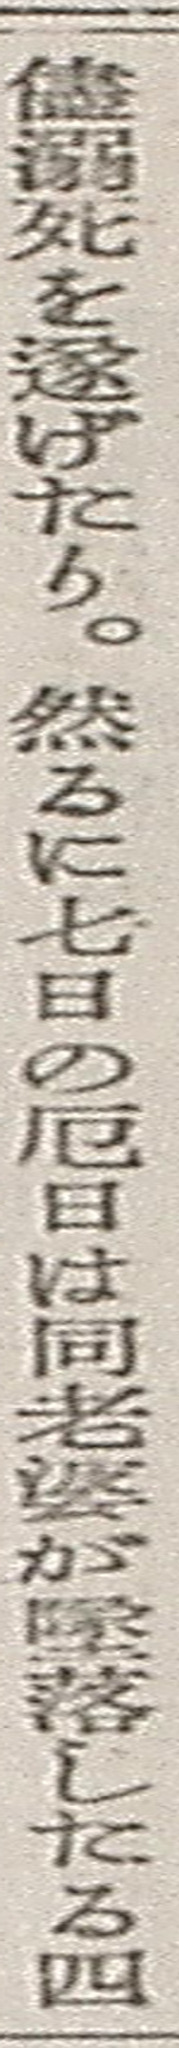侭溺死を遂げたり。然るに七日の厄日は同老婆が墜落したる四
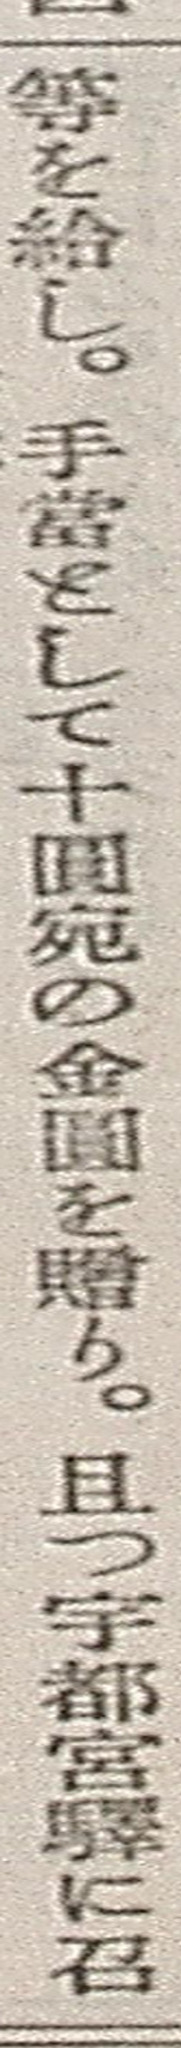等を給し。手当として十円宛の金円を贈り。且つ宇都宮駅に召
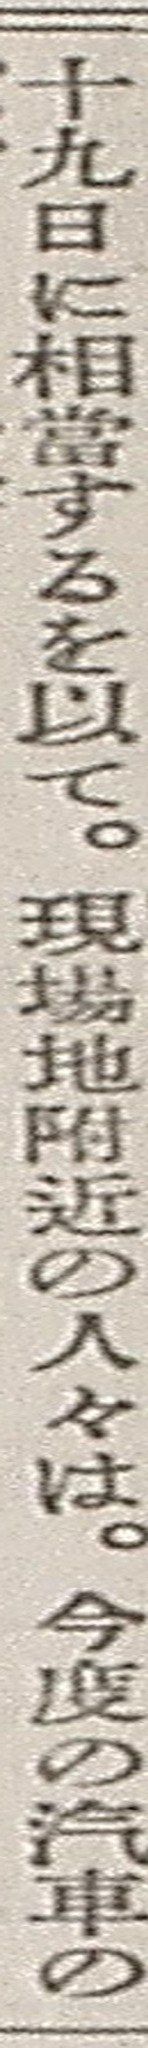十九日に相当するを以て。現場地附近の人々は。今度の汽車の
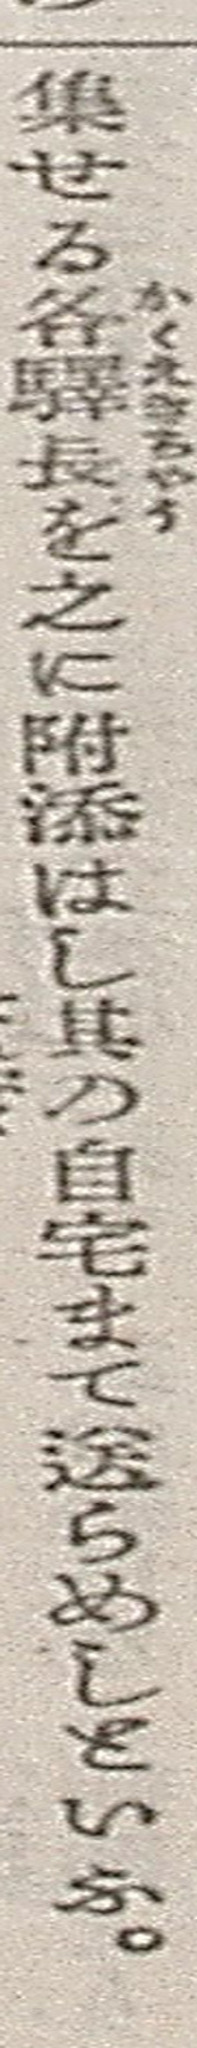集せる各駅長を之に附添はし其の自宅まて送らめしといふ。
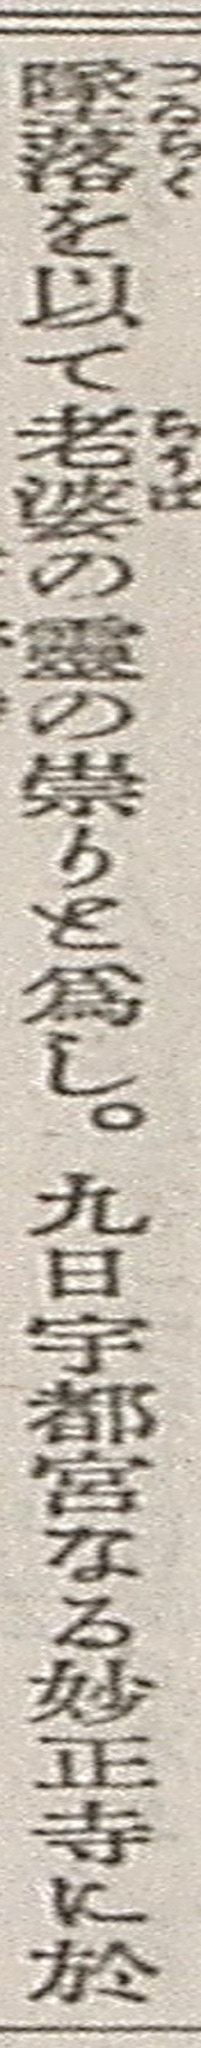墜落を以て老婆の霊の祟りと為し。九日宇都宮なる妙正寺に於
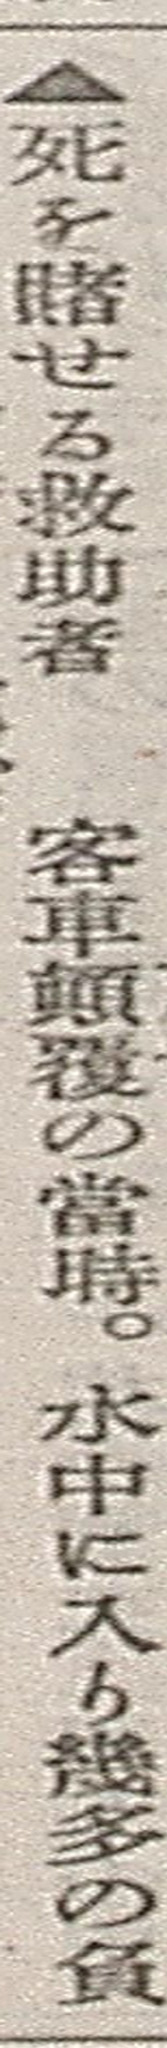▲死を賭せる救助者客車顛覆の当時。水中に入り幾多の負
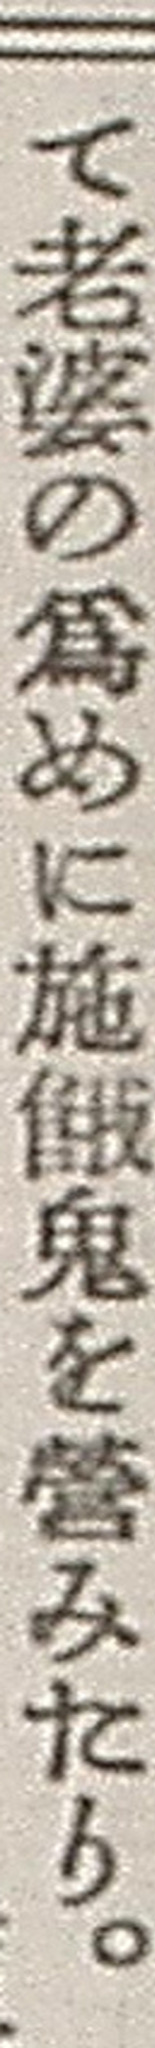て老婆の為めに施餓鬼を営みたり。
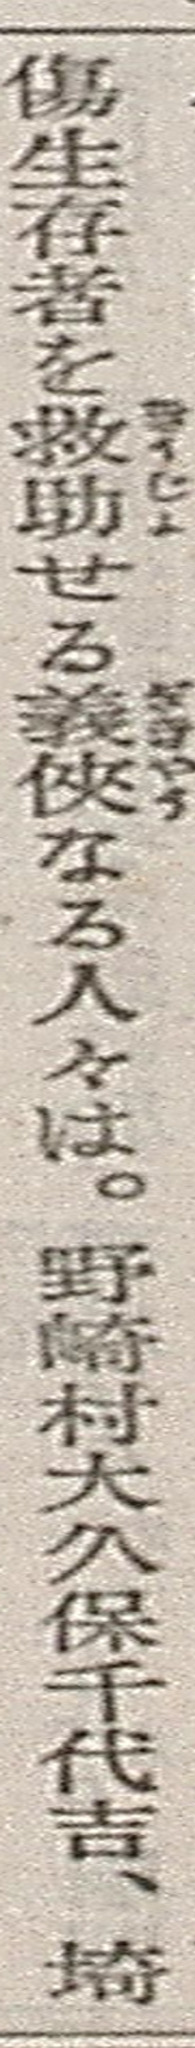傷生存者を救助せる義侠なる人々は。野崎村大久保千代吉、埼
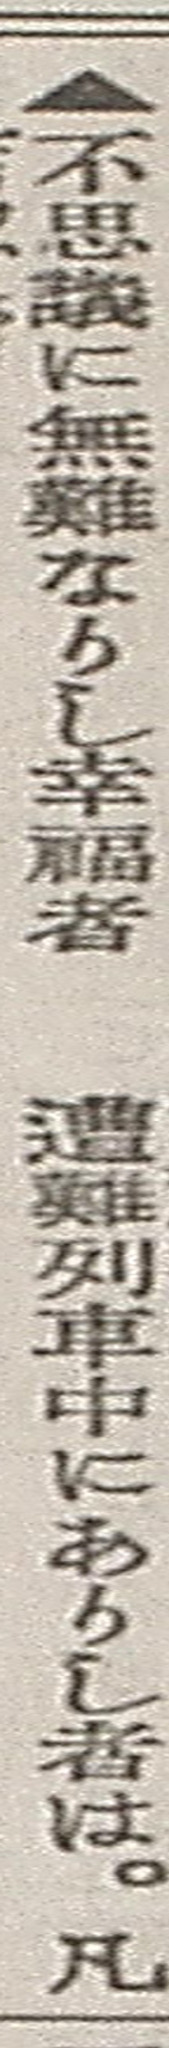▲不思議に無難なりし幸福者遭難列車中にありし者は。凡
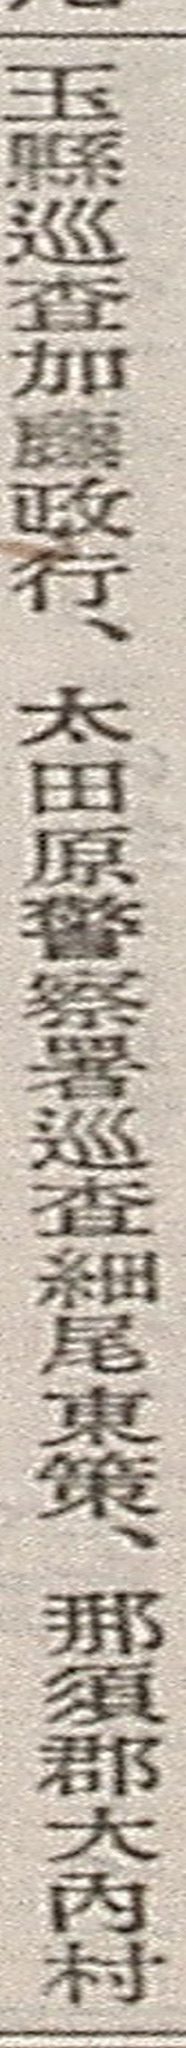玉県巡査加藤政行、太田原警察署巡査細尾東策、那須郡大内村
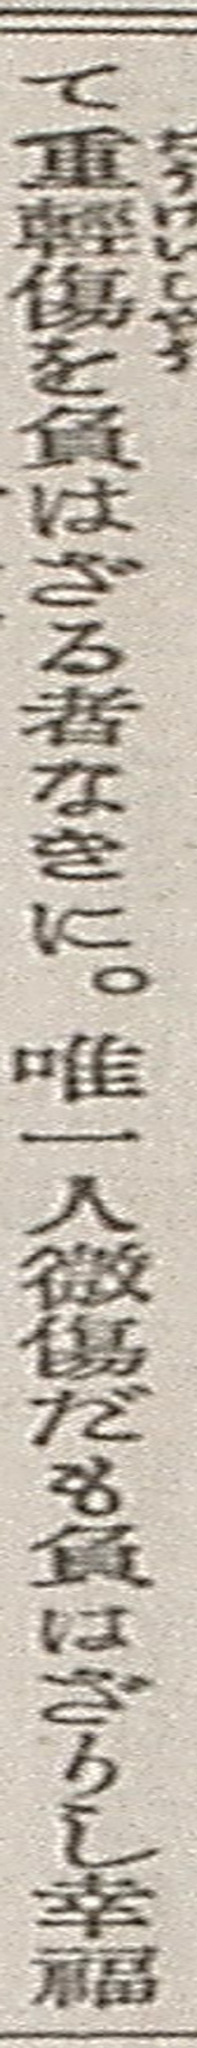て重軽傷を負はざる者なきに。唯一人微傷だも負はざりし幸福
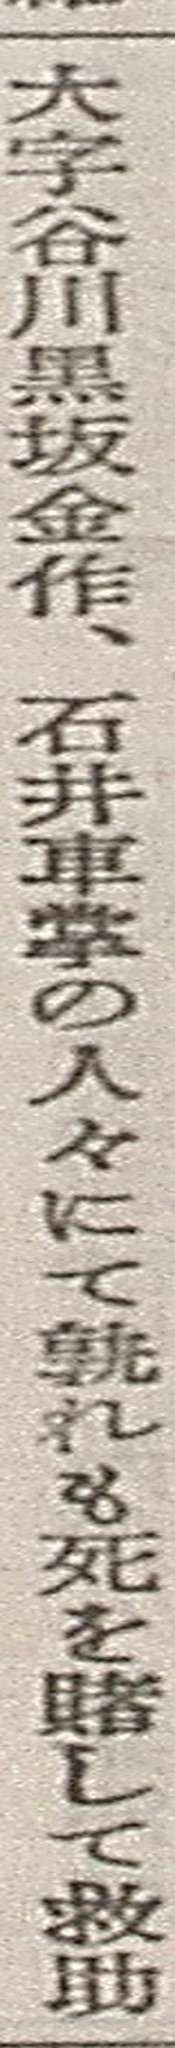大字谷川黒坂金作、石井車掌の人々にて孰れも死を賭して救助
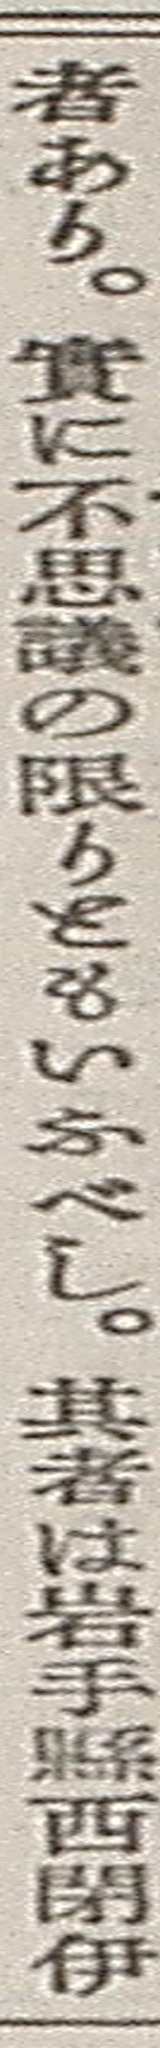者あり。実に不思議の限りともいふべし。其者は岩手県西閉伊
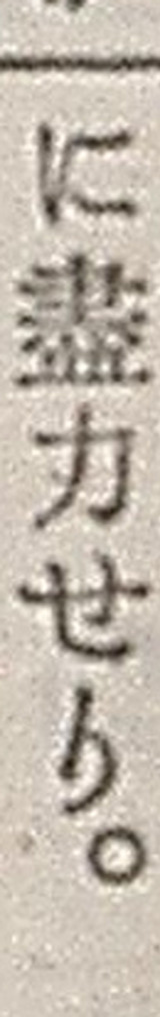に尽力せり。
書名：風俗畫報臨時増刊第百九十九號　明治三十二年十月各地災害圖會（前編之續）
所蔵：東京大学地震研究所図書室 Earthquake Research Institute Library, The University of Tokyo, JAPAN
